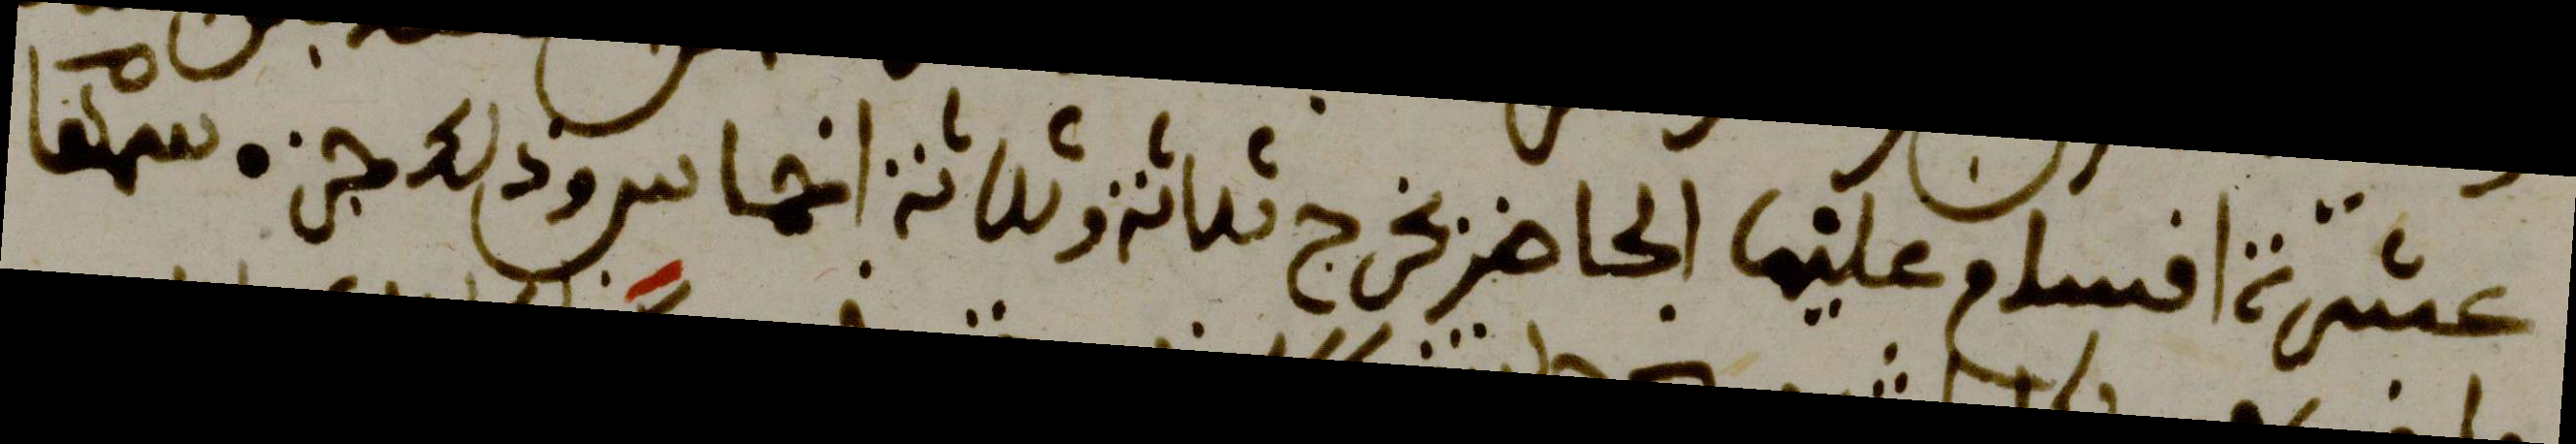عشرة اقسام عليْها الحاضر يخرج ثلاثة وثلاثة اخماس وذلك جزء سهْها
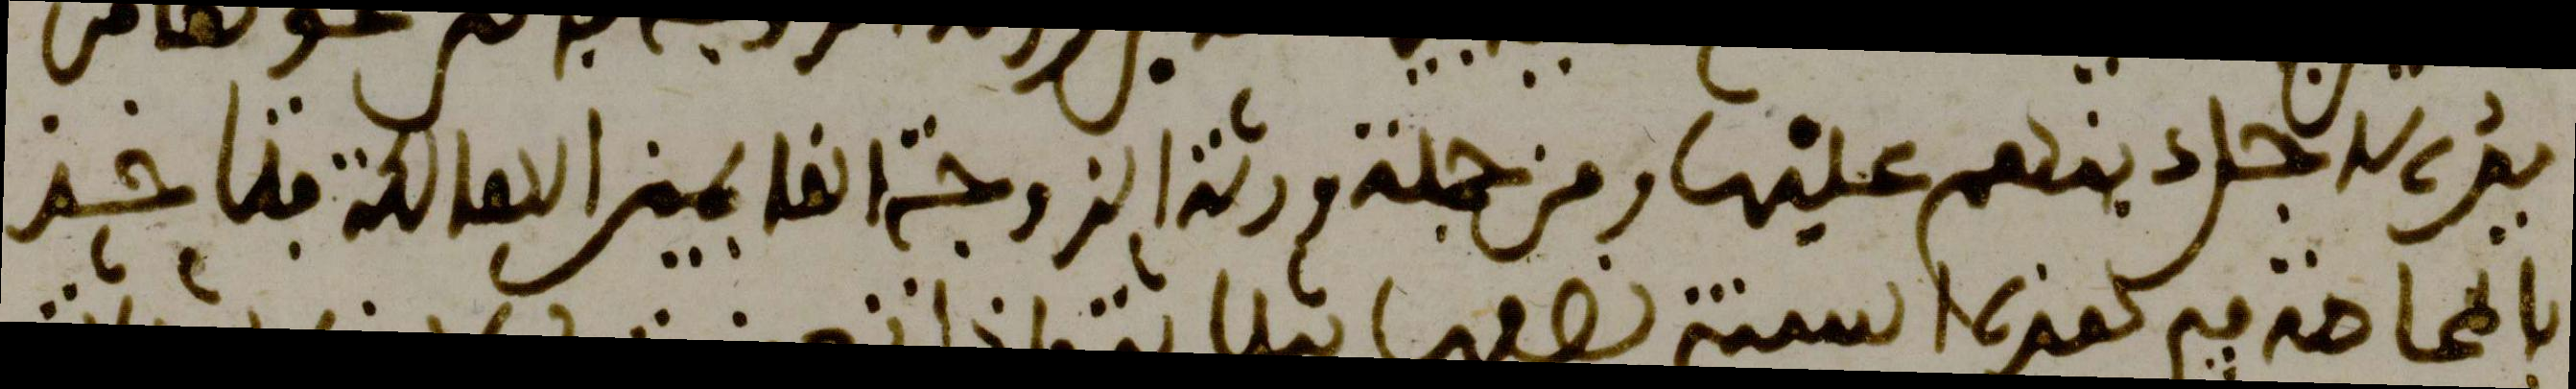يده لاجل ينهم عليْها من جملة ورثة الزوجة القايمين الهالكة فتاخذ
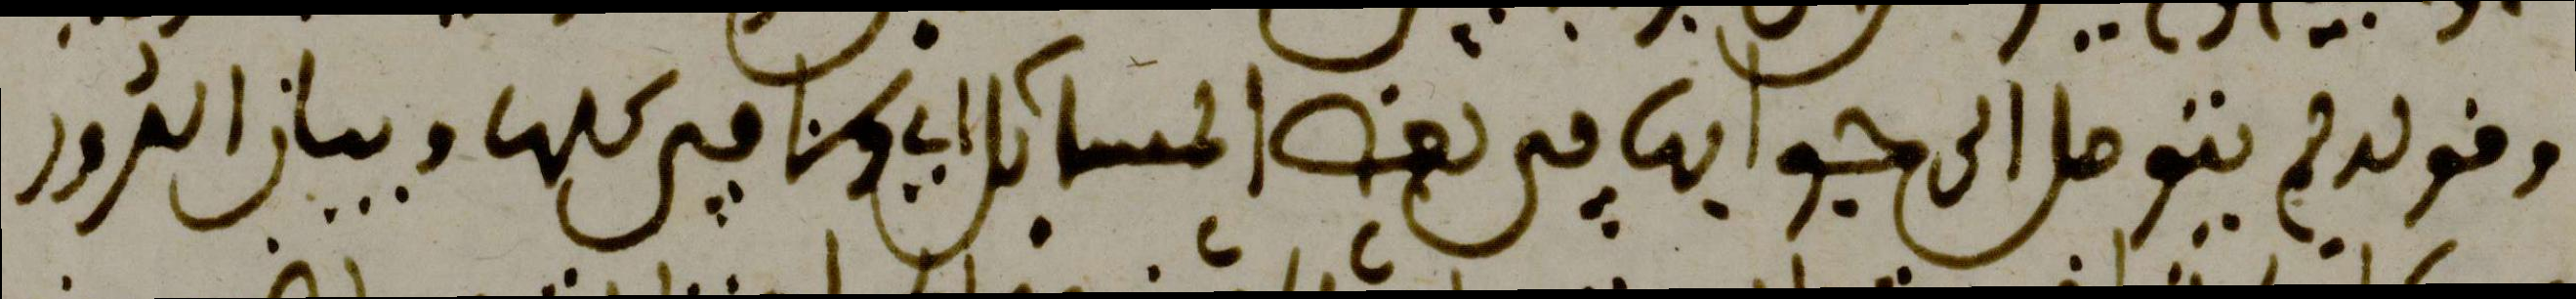وقوله لم يتوصل الى جوابها في بعض المسائل اي ولا في كلها بيان الدور
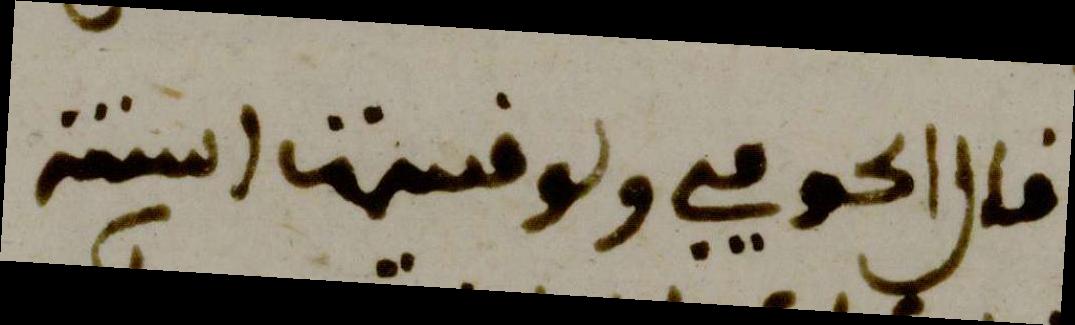قال الحوفي ولو قسمت الستة
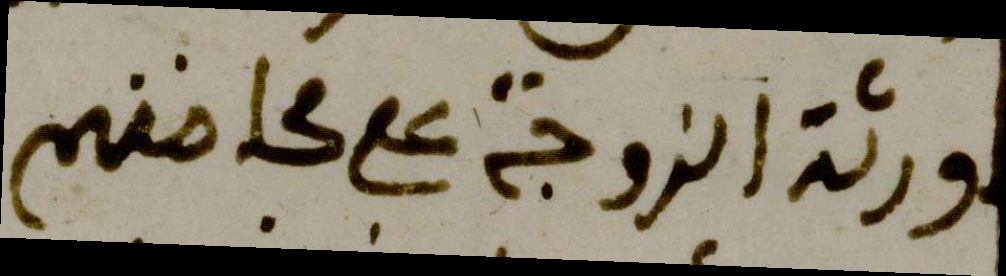ورثة الزوجة على محاصتهم
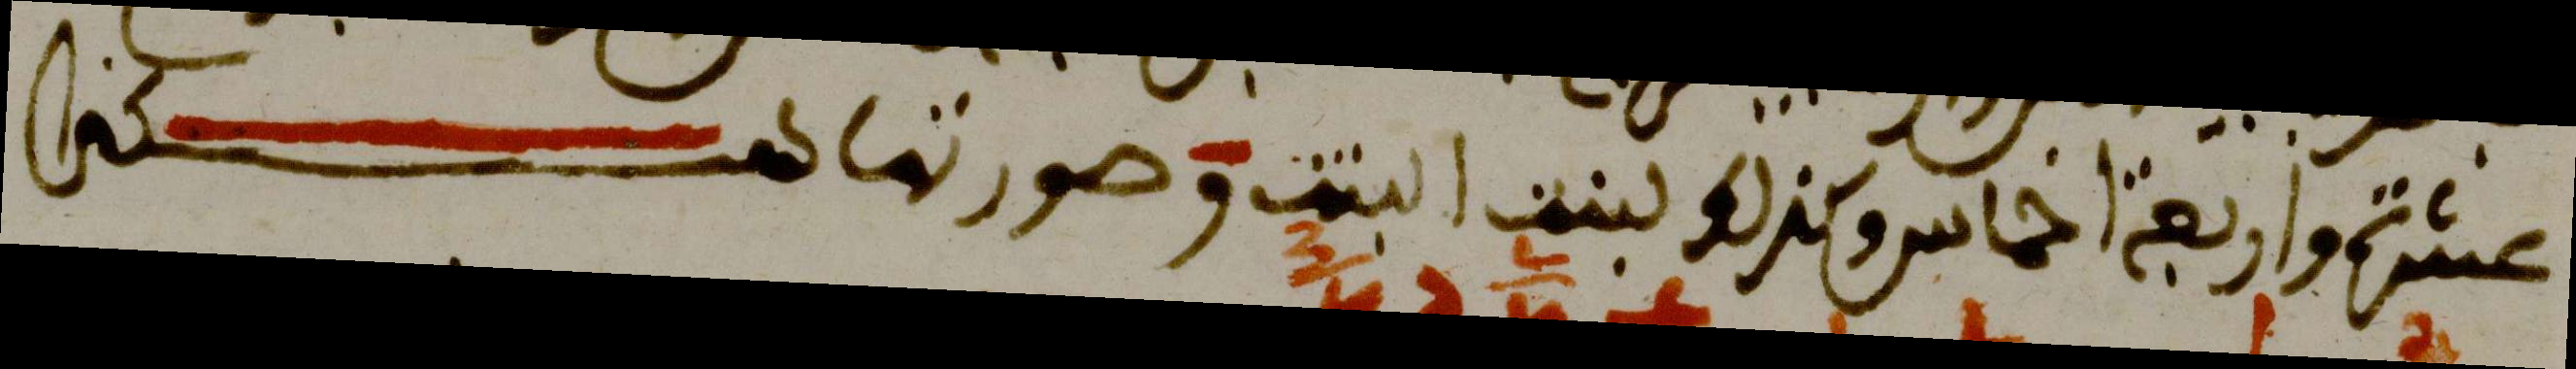عشرة واربعة اخماس وكذلك لبنت البنت وَصورتها هَكذا
